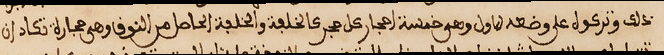ذلك وتركوه على وضعه لاول وهى خمسة احجار كل حجر كالخلفة والخلفة الحاصل من النوق وهى حجارة تكاد ان
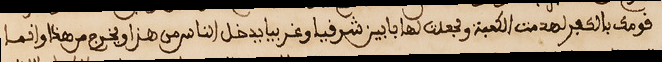قومك بالكفر لهدمت الكعبة ولجعلت لها بابين شرقيا وغربيا يدخل الناس من هذا ويخرج من هذا وانما
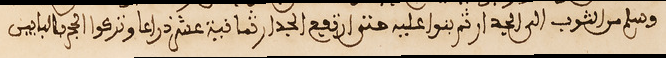وسلم من الثوب الى الجدار ثم بنوا عليه حتى ارتفع الجدار ثمانية عشر ذراعا وتركوا الحجر بالبابين
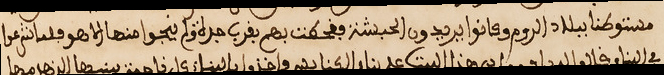مستوطنا ببلاد الروم وكانوا يريدون الحبشة فقحطت بهم بقرب جدة ولم ينجوا منها الا هو فلما شرعوا
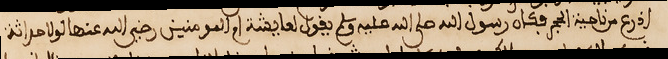اذرع من ناحية الحجر فكان رسول الله صلى الله عليه وسلم يقول لعايشة ام المومنين رضي الله عنها لولا حداثة
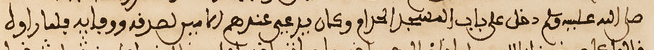صلى الله عليه وسلم دخل على باب المسجد الحرام وكان يدعي عندهم الامين لصدقه ووفايه فلما راوه
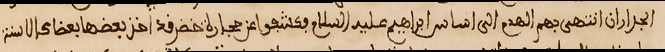الجدار ان انتهى بهم الهدم الى اساس ابراهيم عليه السلام فكشفوا عن حجارة خضر قد اخذ بعضها بعضا كالاسنة
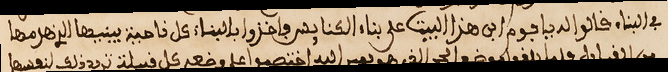في البناء قالوا له يا فوم ابن هذا البيت على بناء الكنائس فاخذوا بالبناء كل ناحية يبنيها الذي هدمها
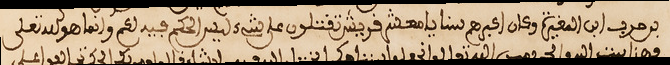بن حرب ابن المغيرة وكان اكبرهم سنا يا معشر قريش تقتلون على شىء ليس الحكم فيه لكم وانما هو لله تعلى
